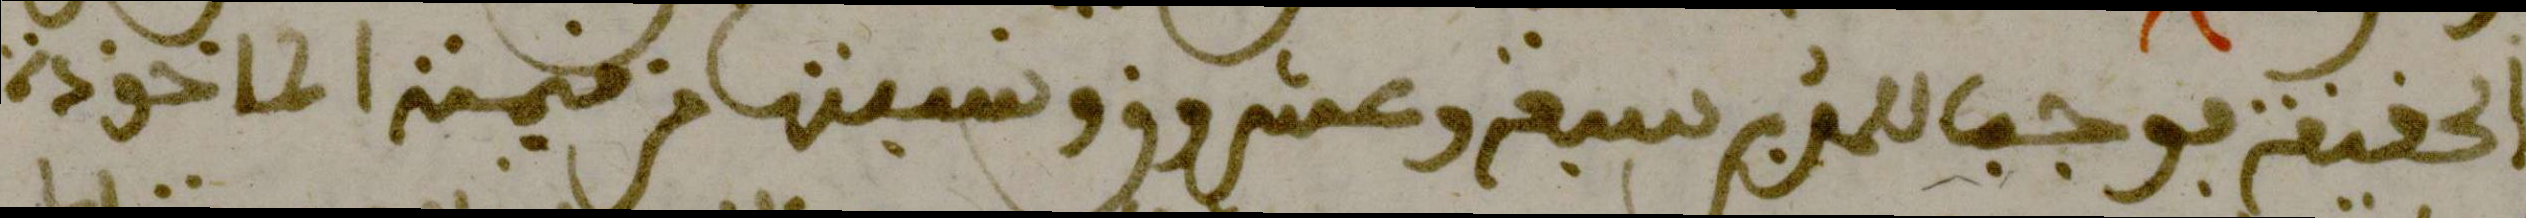الحقيقية فوجب للمدبر سبعة وعشرون ونسبتها من قيمته الماخوذة
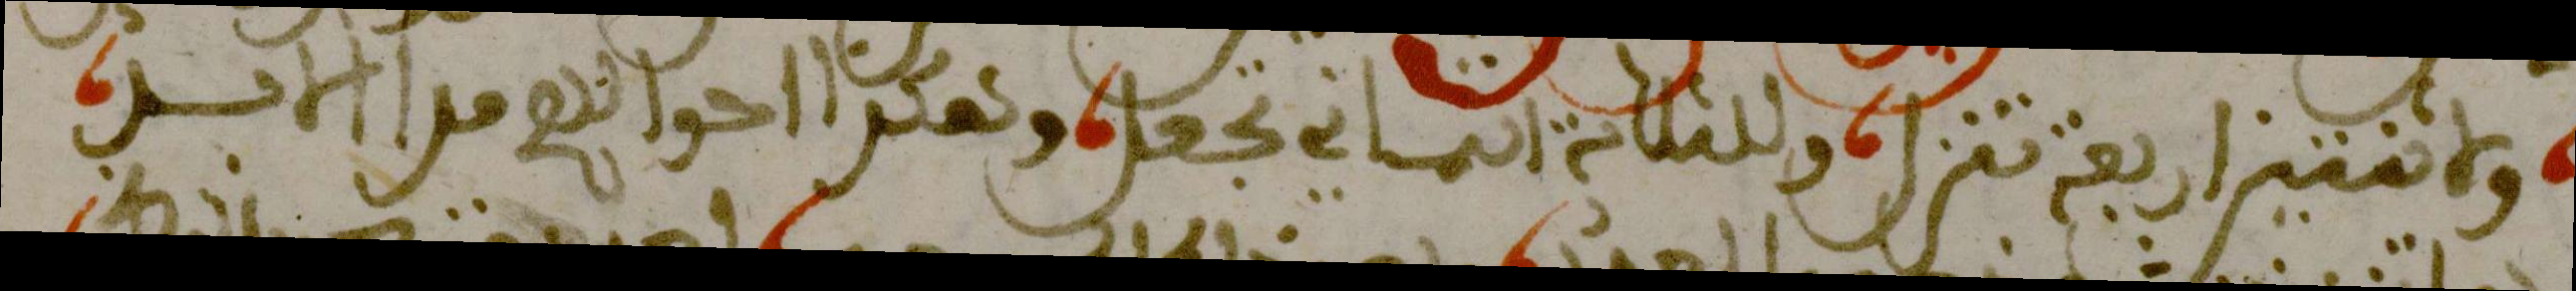ولا ثنتين اربعة تنزل وللثلاثة الثمان يجعل وهكذا احوالهم مدا الابد
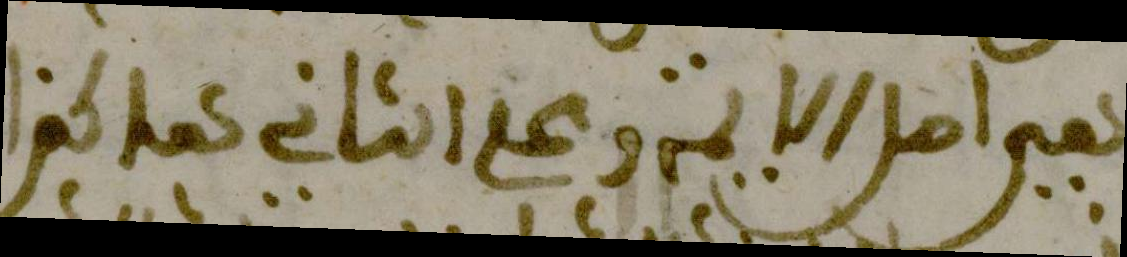هي اصل الايمة وعلى الثاني هاكذا
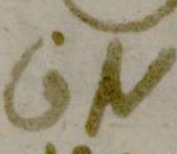لان
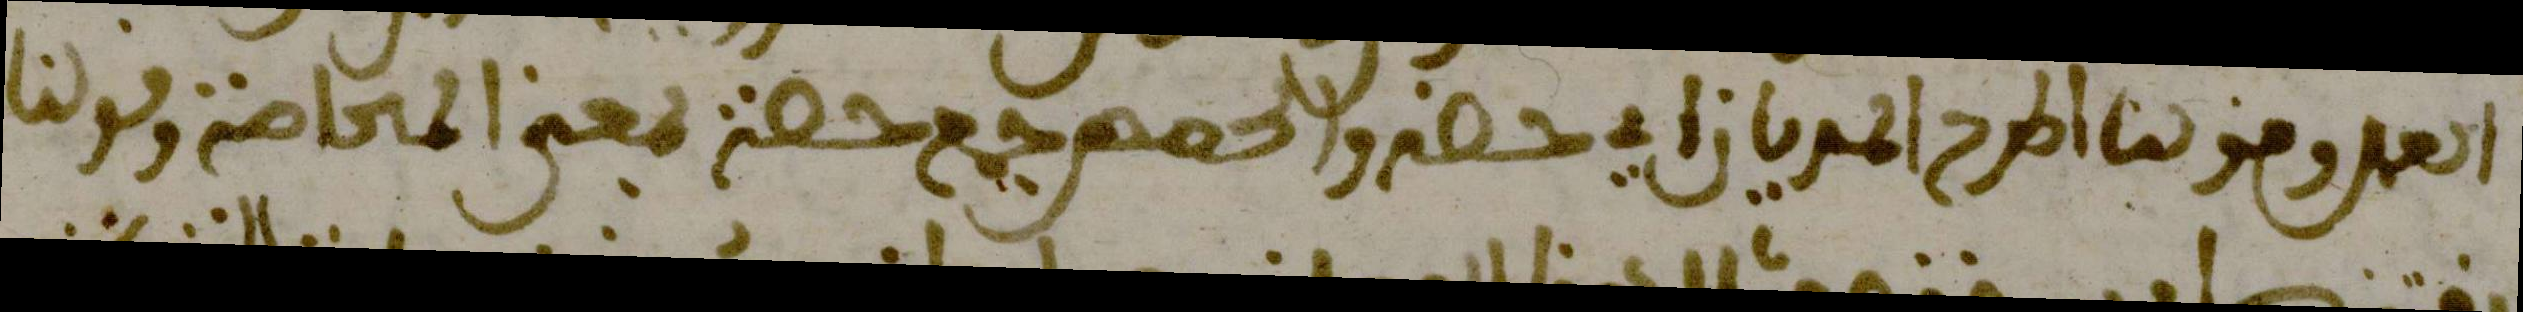العمل وقولنا اطرح المديان اي حضه والحصص جمع حصة بمعنى المحاصة وقولنا
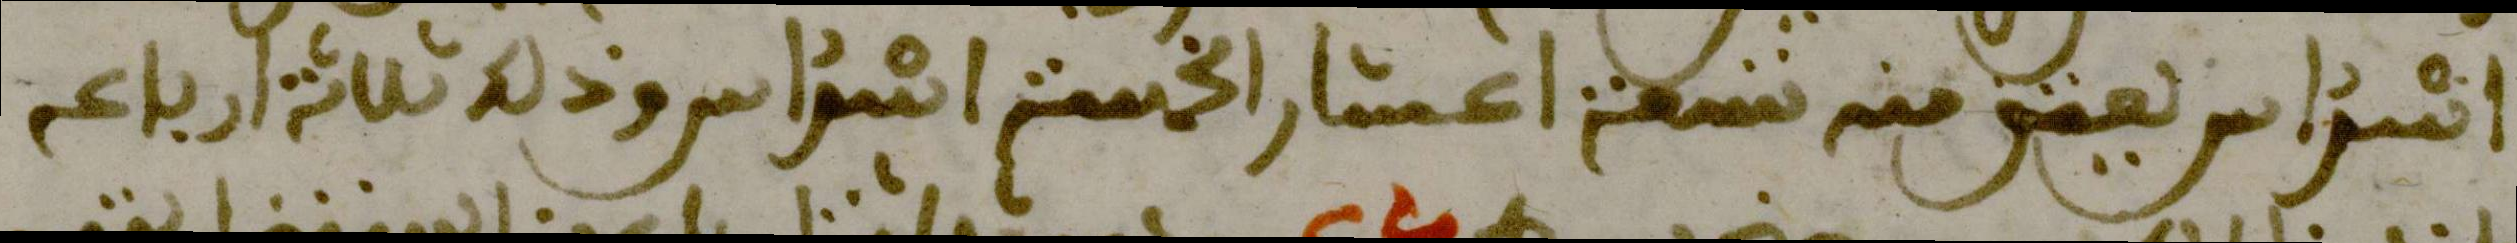اسْداس يعتق منه تسعة اعشار الخمسة اسْداس وذلك ثلاثة ارباعه
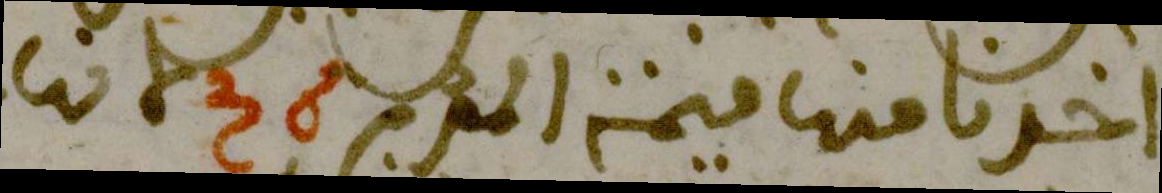اخذنا منها قيمة المدبر 36 لانها
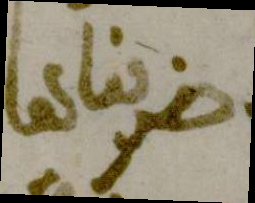ضربناها
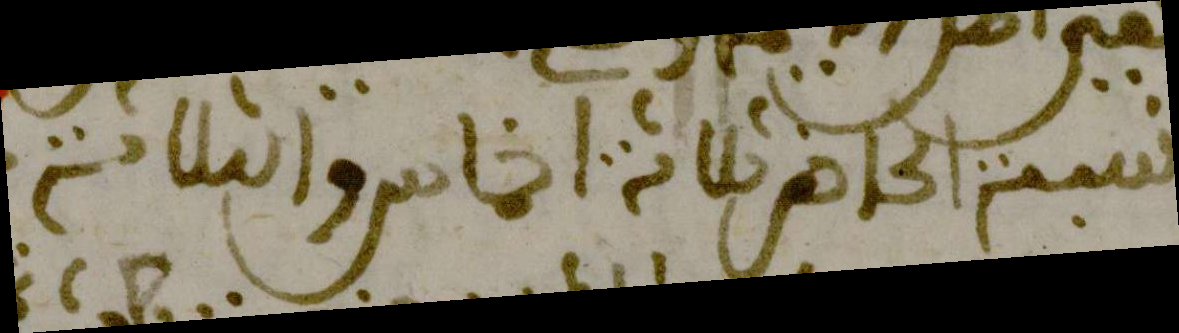نسبة الحاضر ثلاثة اخماس والثلاثة
